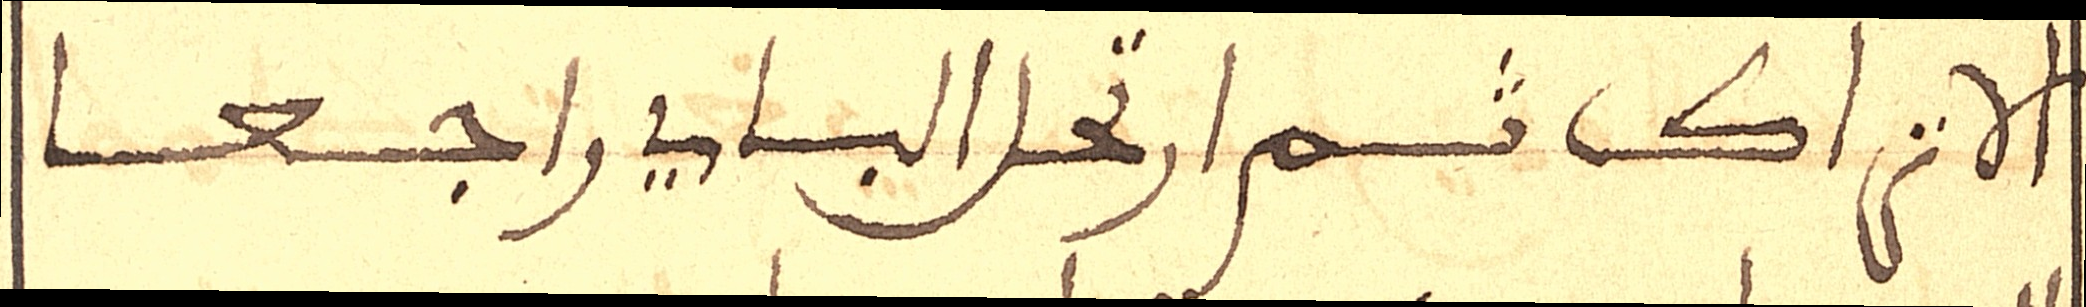الاتراك ثم ارتحل الباي راجعا
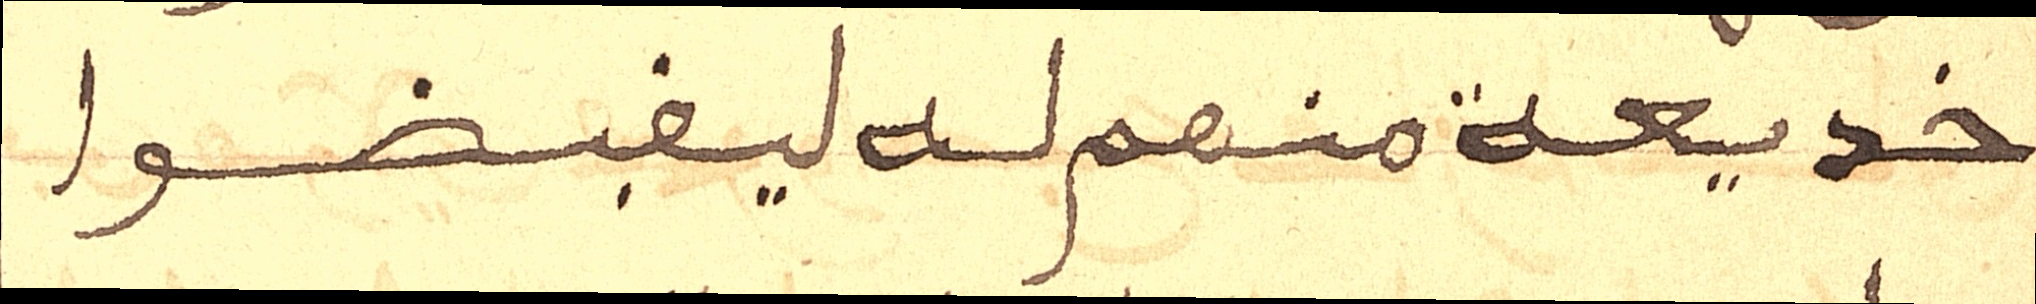خديعة منهم له ليقبضوا
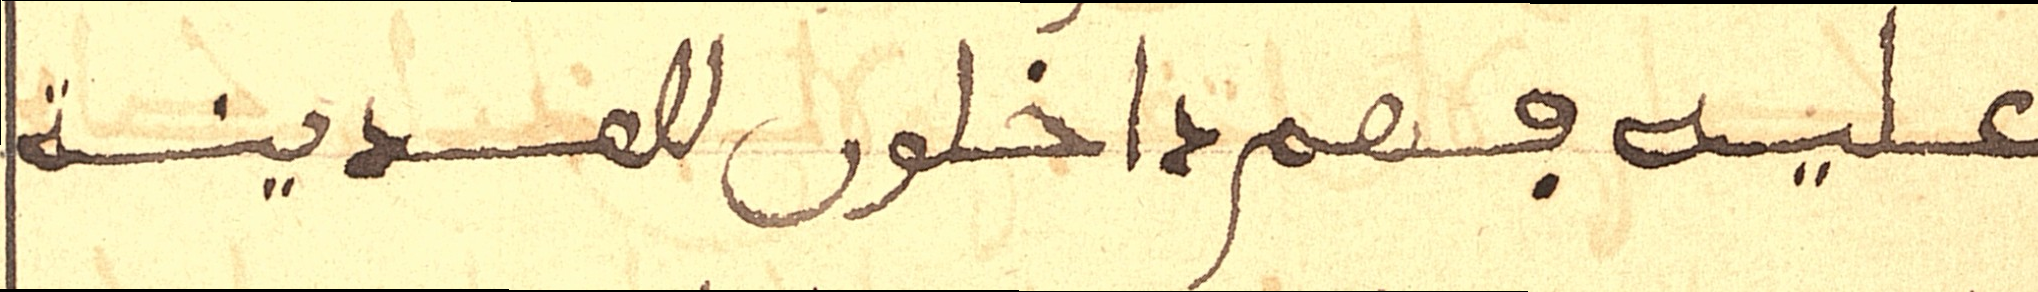عليه فهم داخلون للمدينة
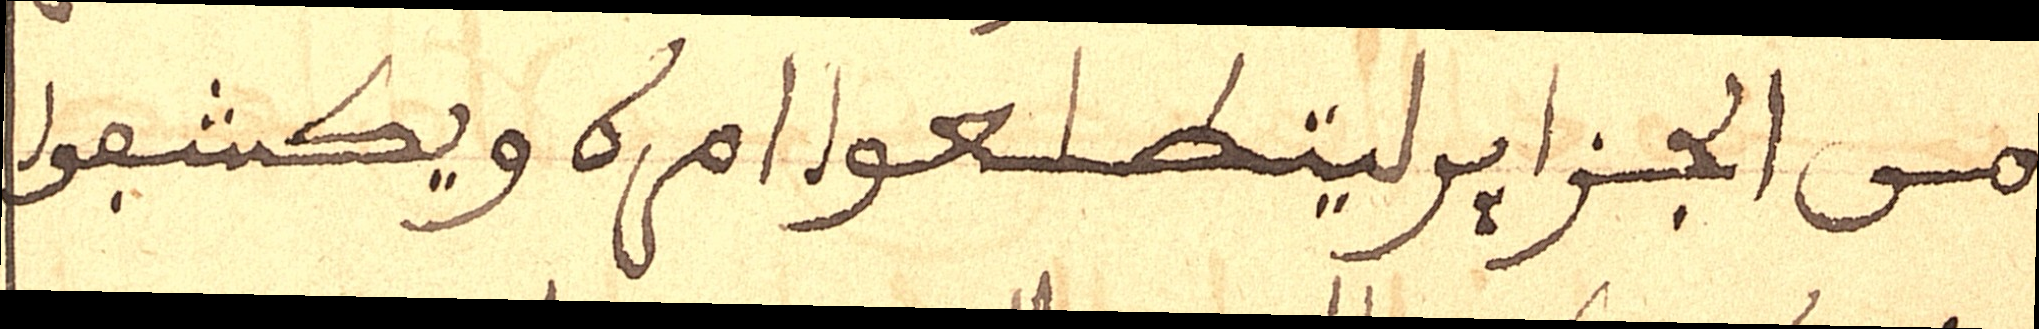من الجزائر ليتطلعوا امره ويكشفوا
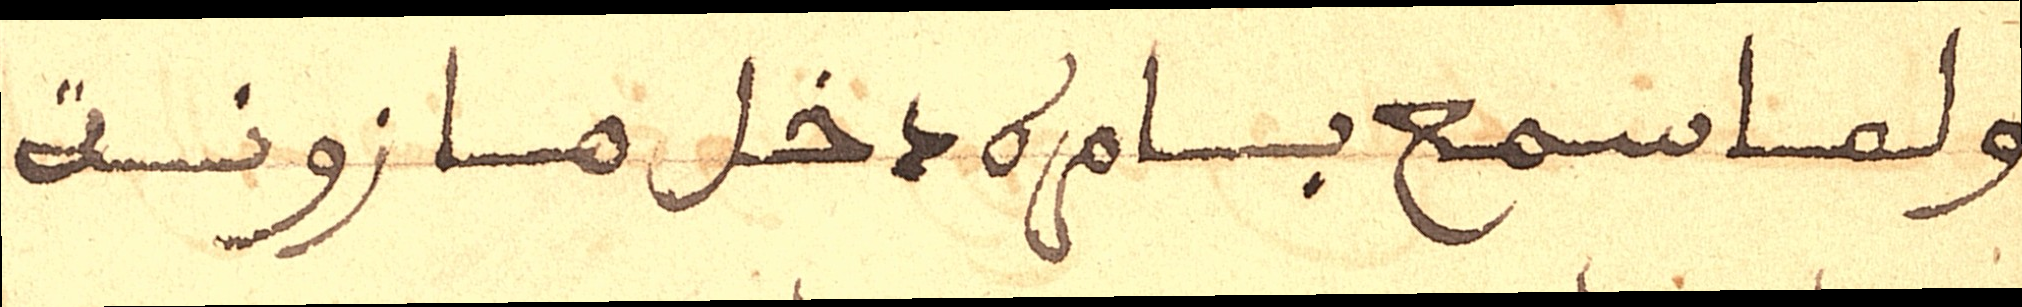ولما سمع بامره دخل مازونة
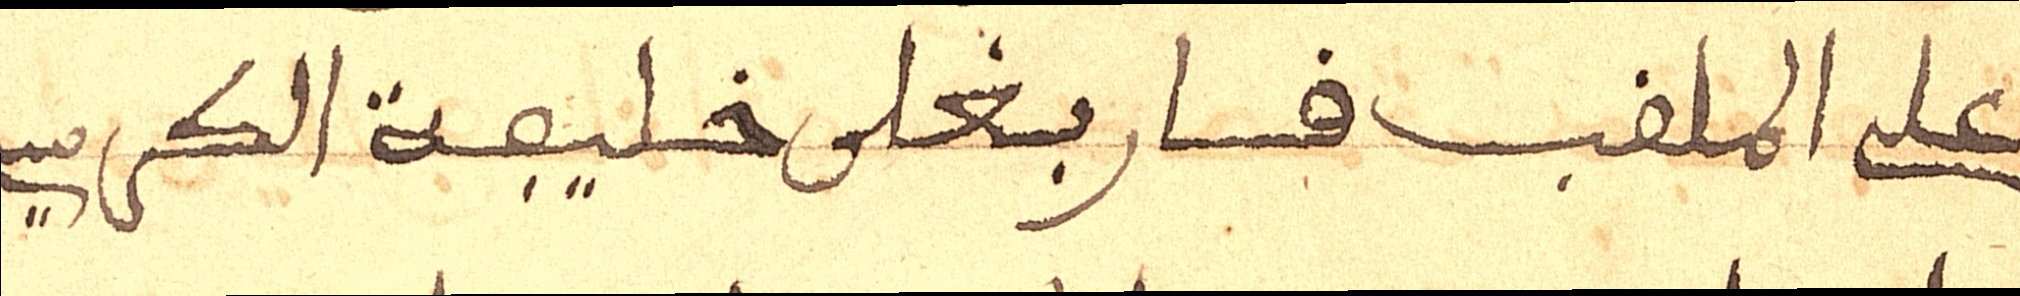على الملقب قار بغلن خليفة الكرسي
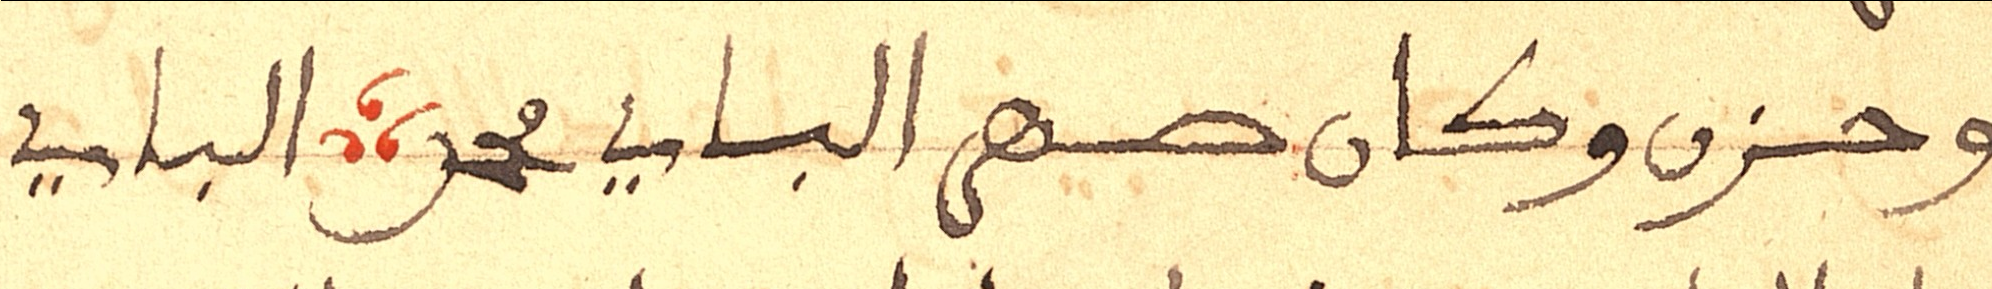وحزن وكان صهر الباي محمد الباي
